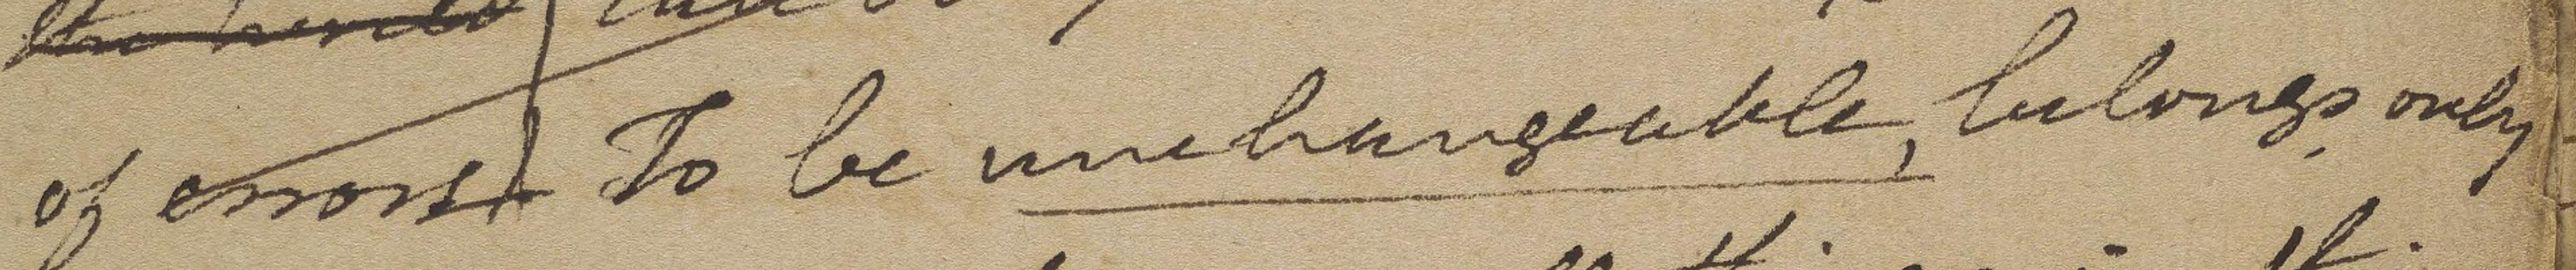of errors. To be unchangeable belongs only
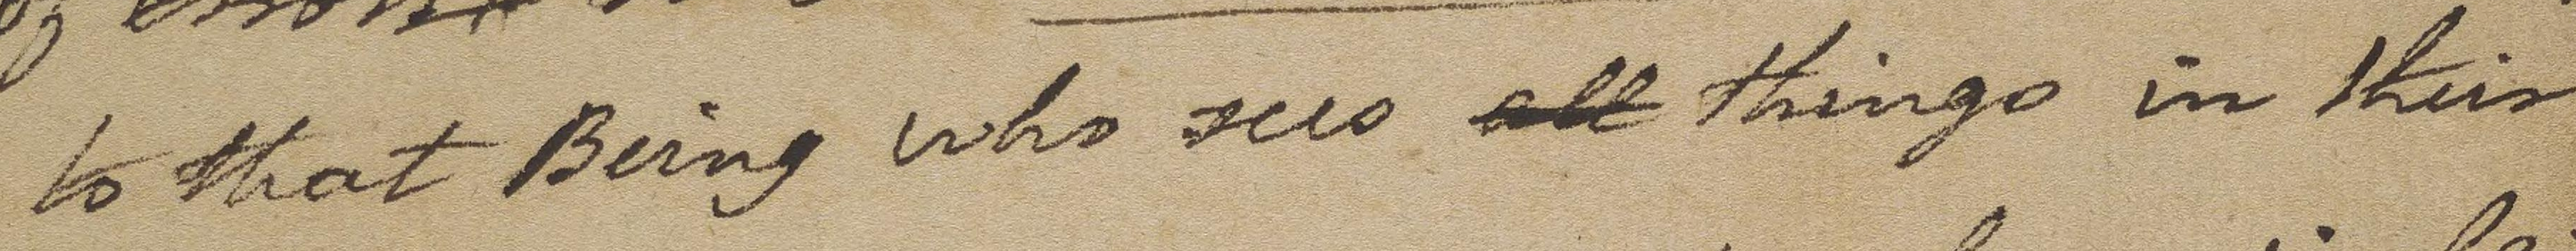to that Being who sees [all] things in this
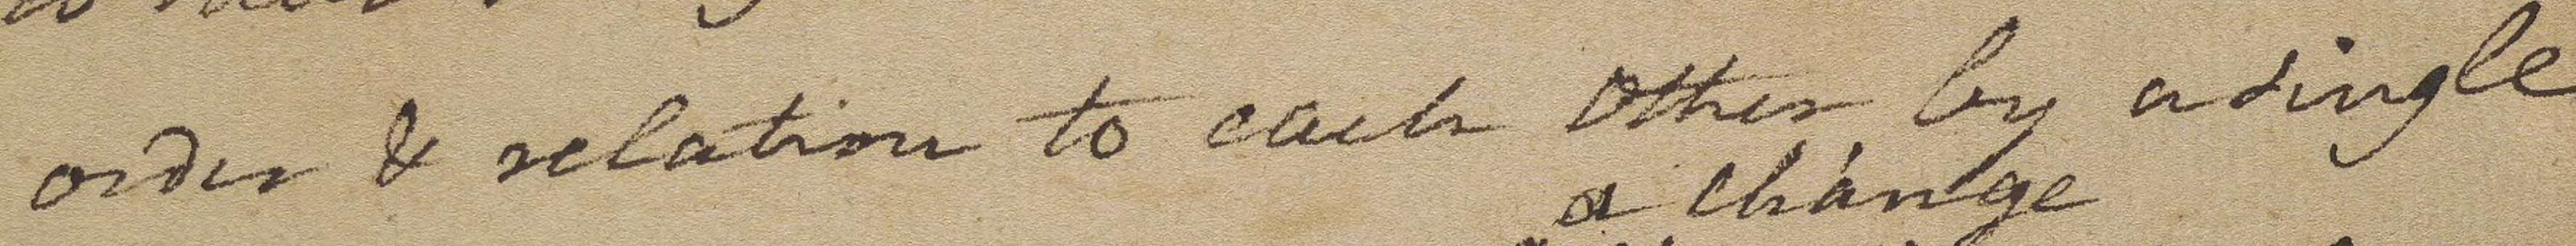order & relation to each other by a single
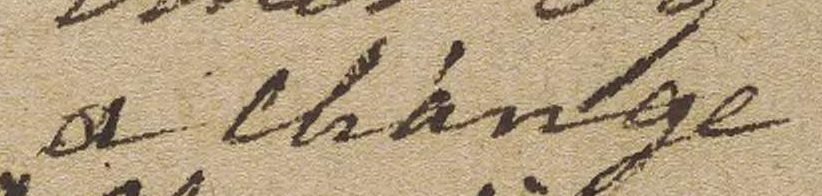a change
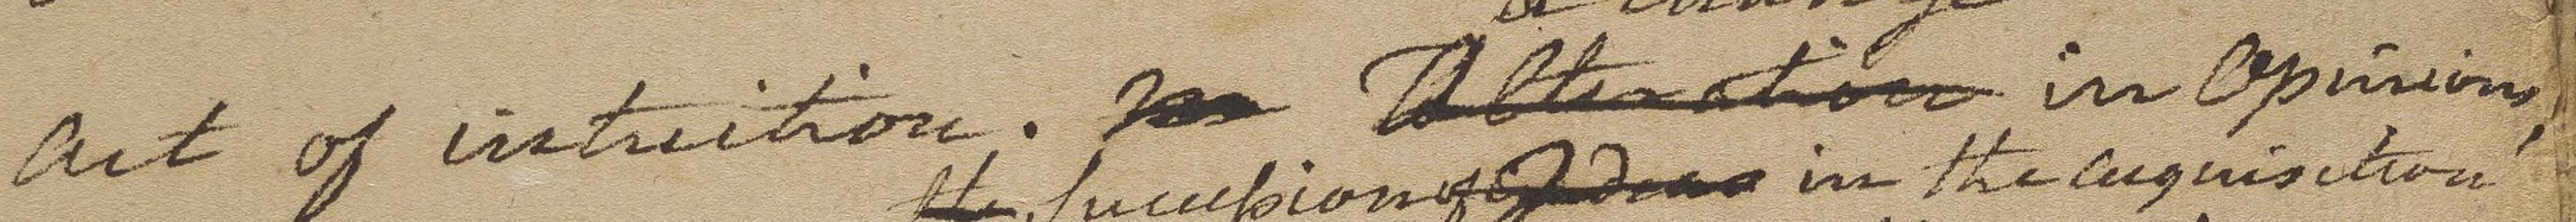act of intuition. [no Alteration] in opinion
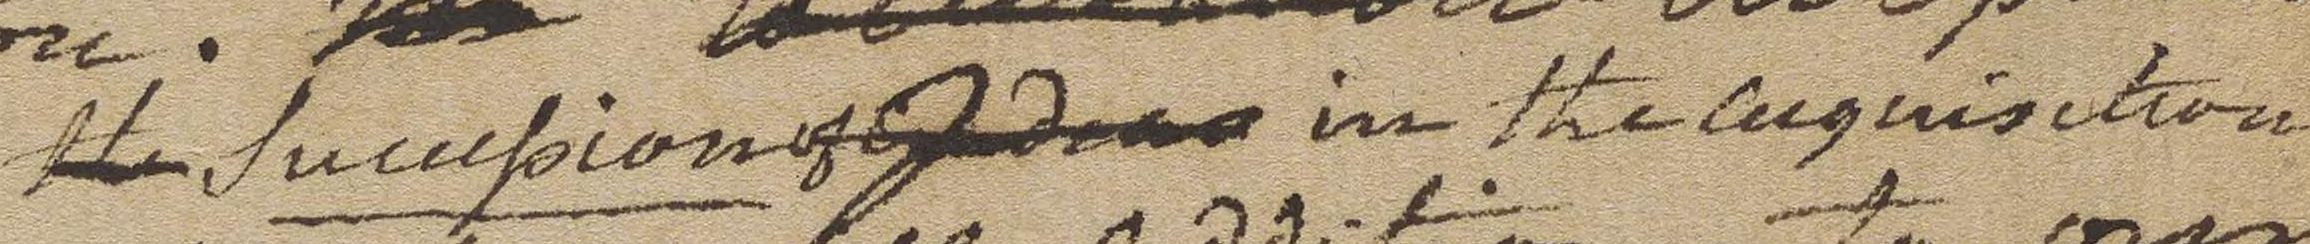[the] succession [of Ideas] in the acquisition
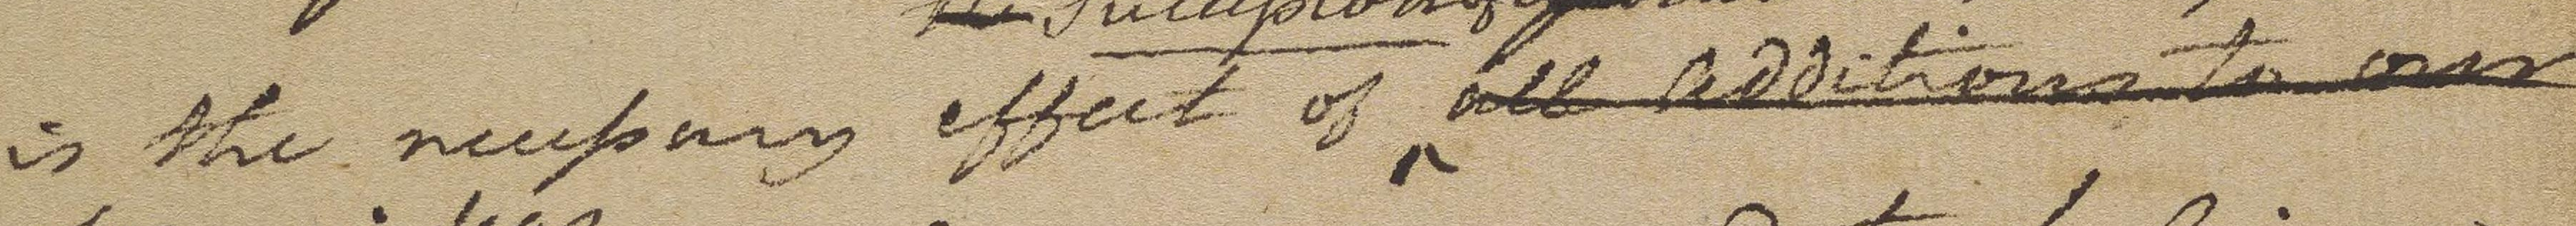is the necessary effect of ^ [all Additions to our]
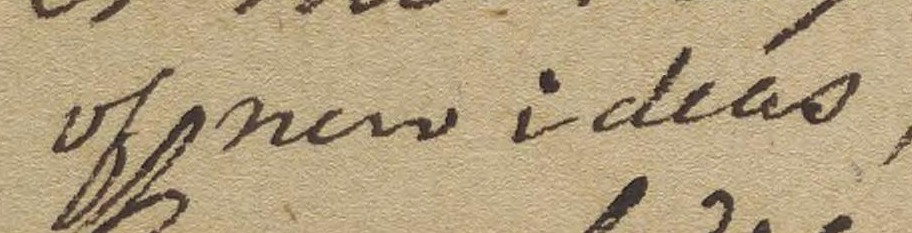of new ideas,
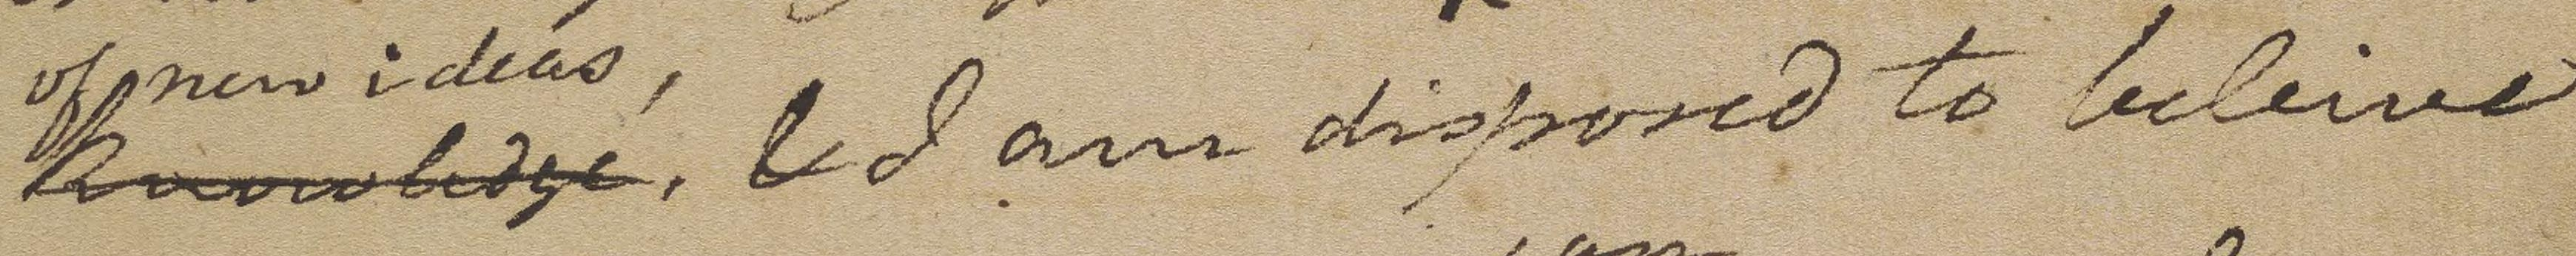[knowledge], of new ideas & I am disposed to believe
